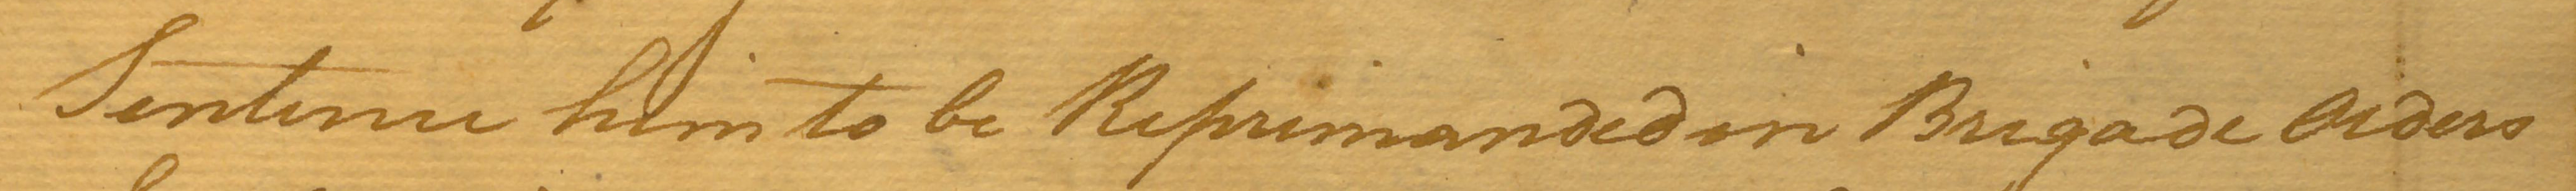sentence him to be Reprimanded in Brigade Orders
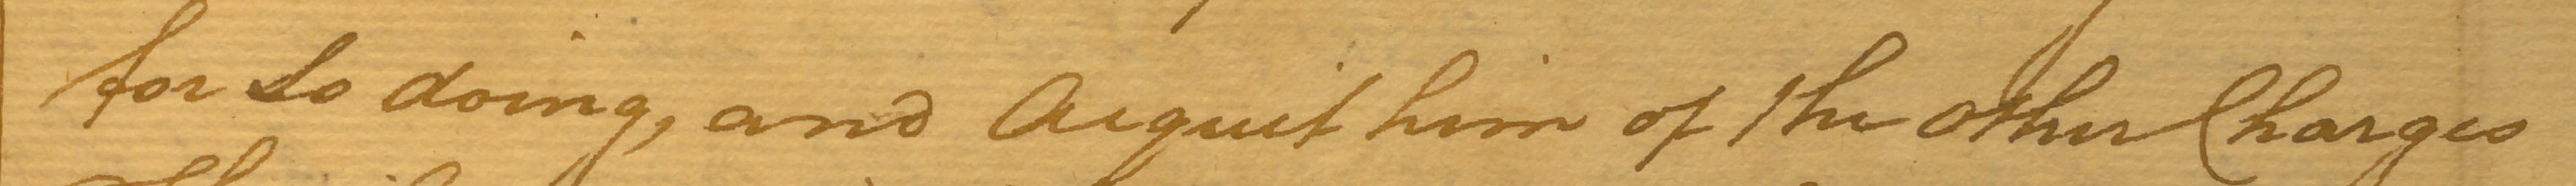for so doing, and acquit him of the other Charges
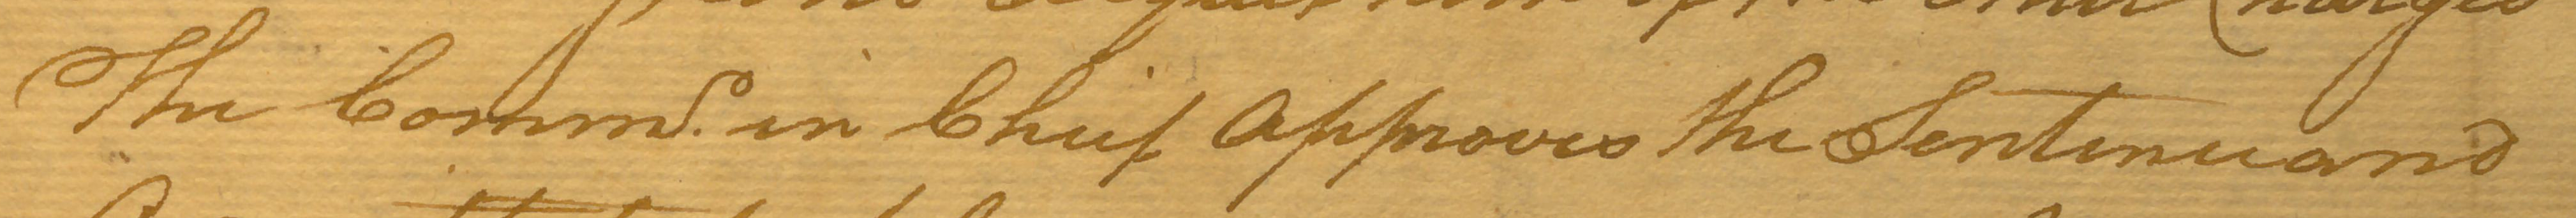The Comm^r. in Chief approves the Sentence and
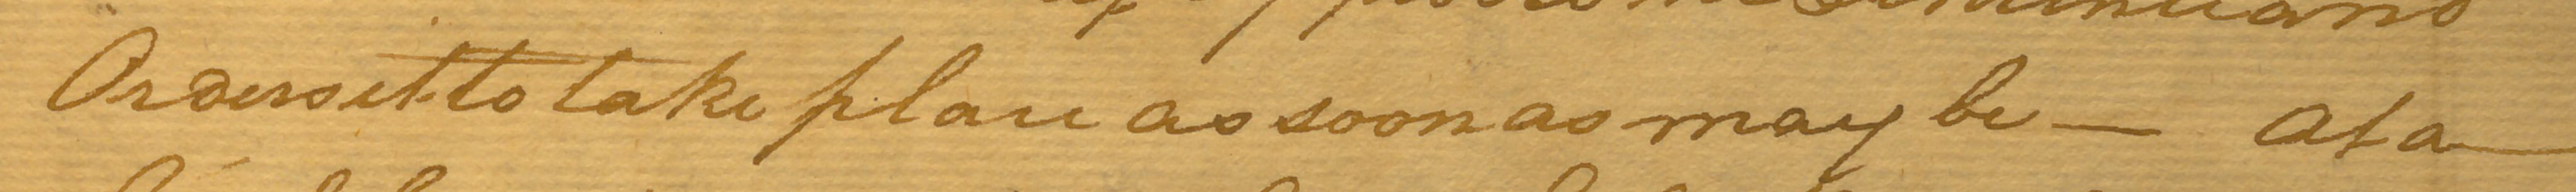Orders it to take place as soon as may be- At a
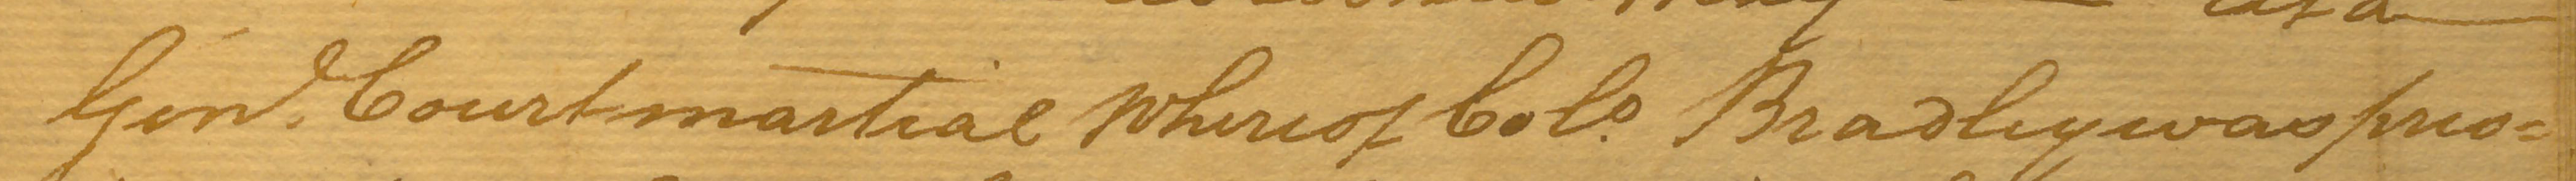Gen^l. Court martial whereof Col^o. Bradley was pres-
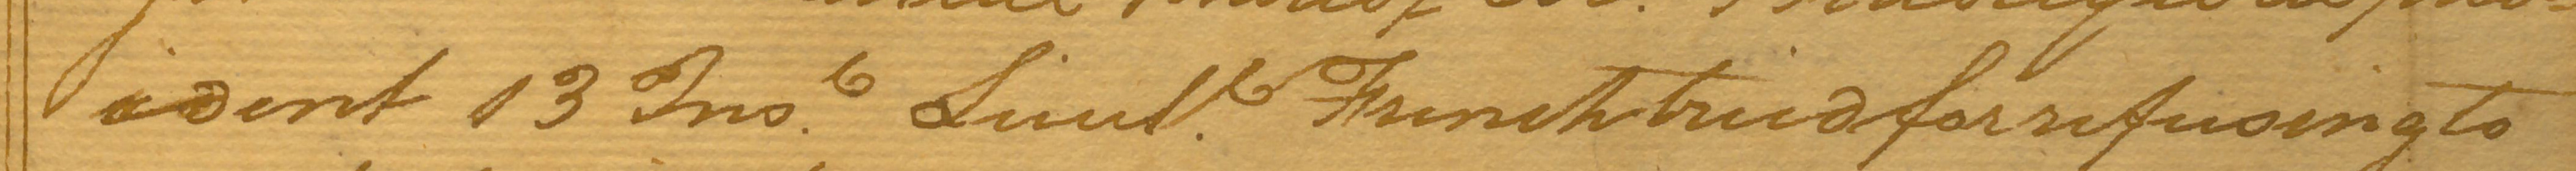ident 13 Ins^t. Lieut^t. French tried for refusing to
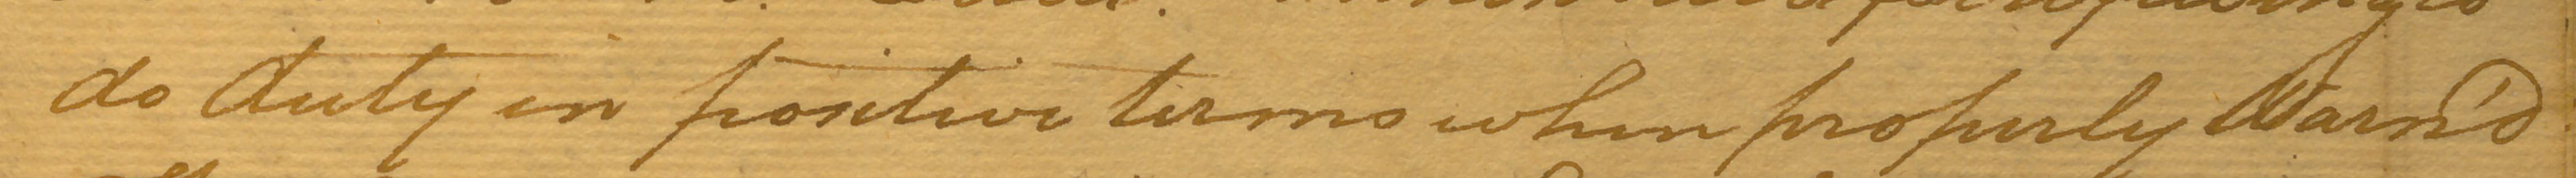do duty in positive terms when properly warn'd
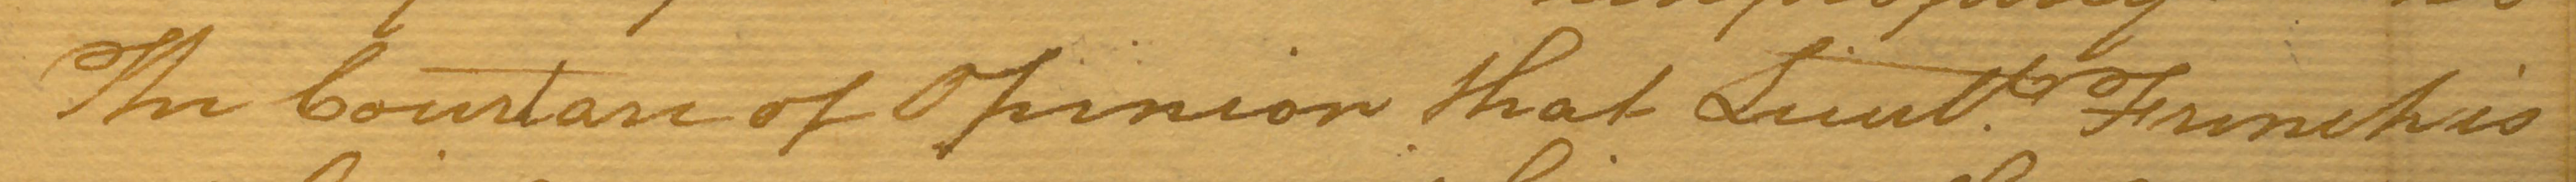The Court are of Opinion that Lieut^t. French is
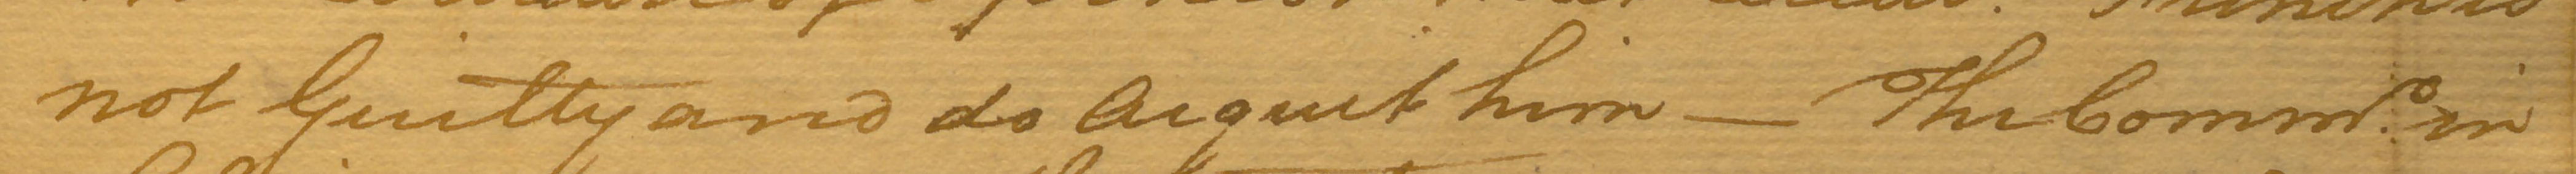not Guilty and do acquit him- The Comm^r. in
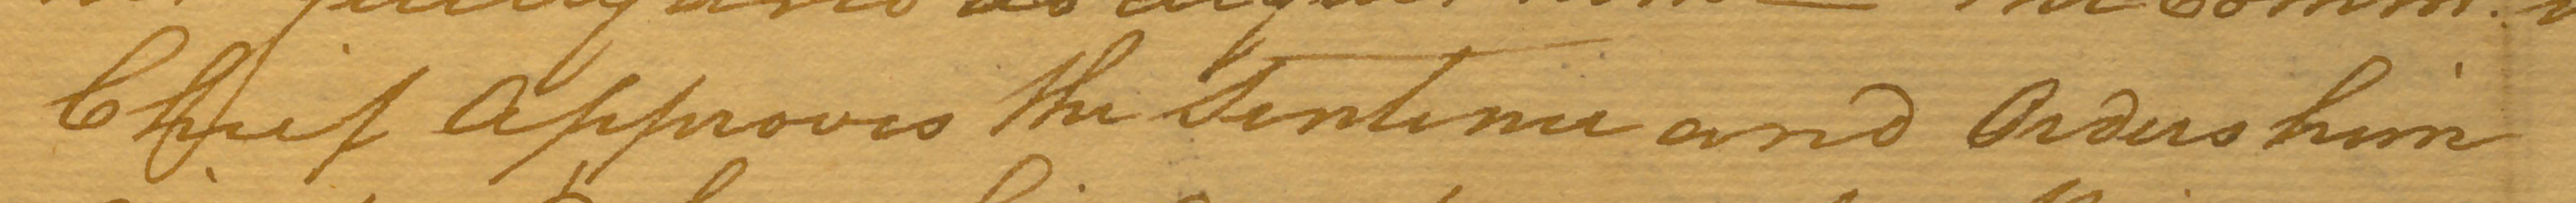Chief approves the sentence and orders him
